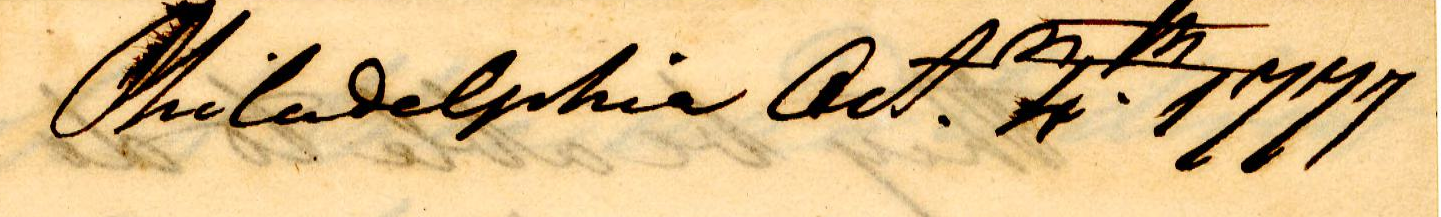Philadelphia Oct.^r 4^th. 1777
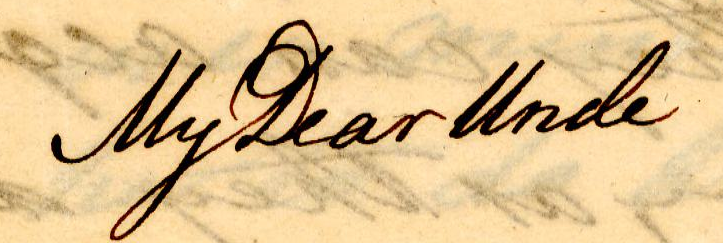My Dear Uncle
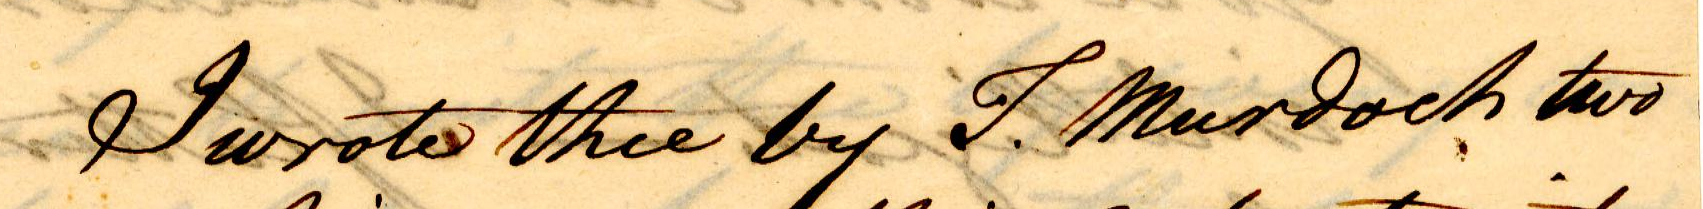I wrote thee by T. Murdoch two
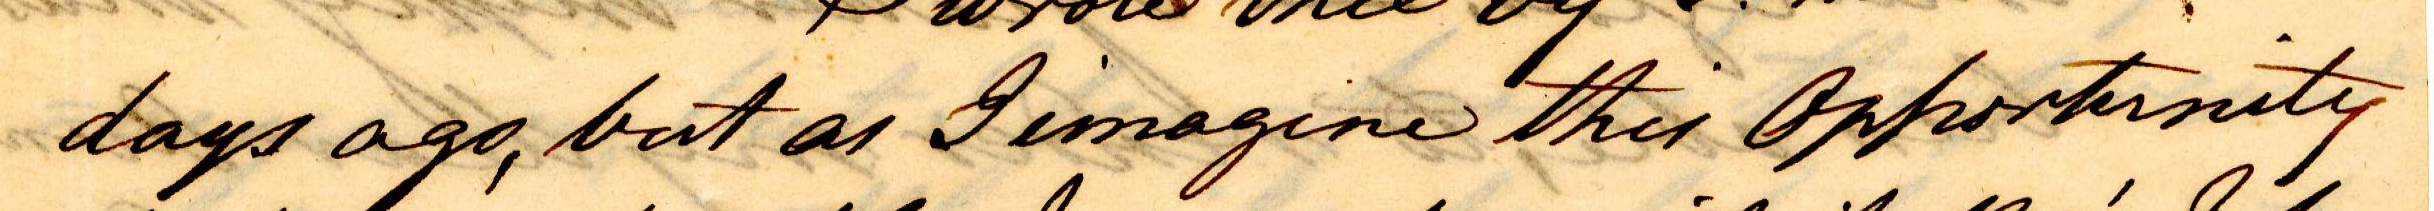days ago, but as I imagine this Opportunity
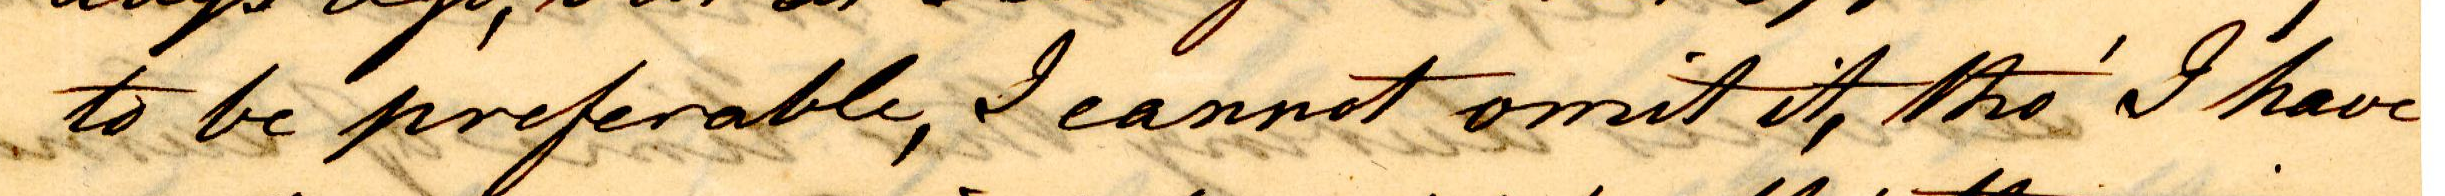to be preferable, I cannot omit it, tho' I have
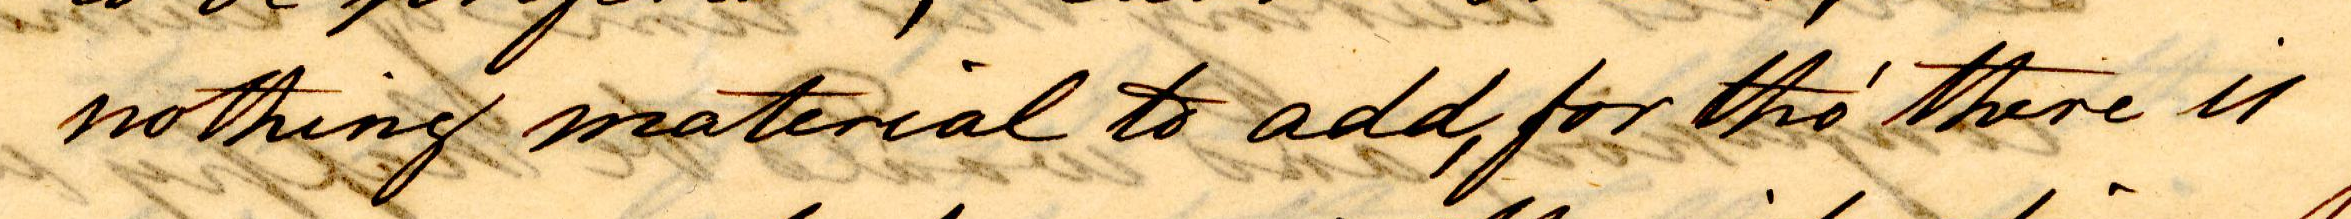nothing material to add, for tho' there is
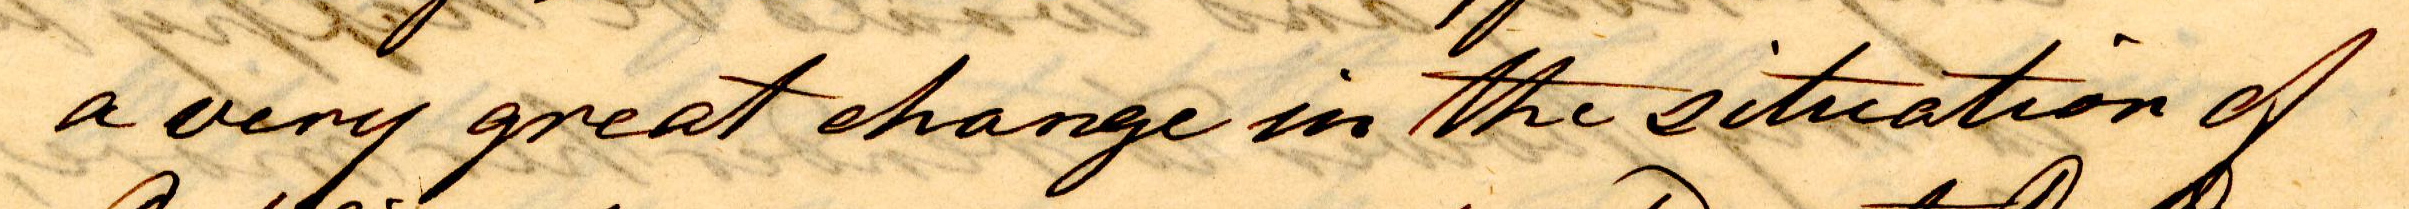a very great change in the situation of
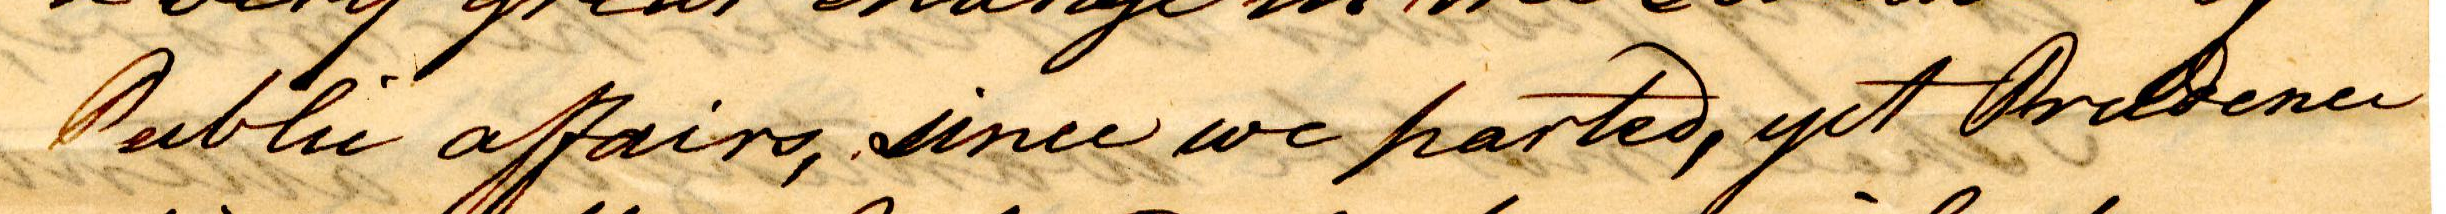Public affairs, since we parted, yet Prudence
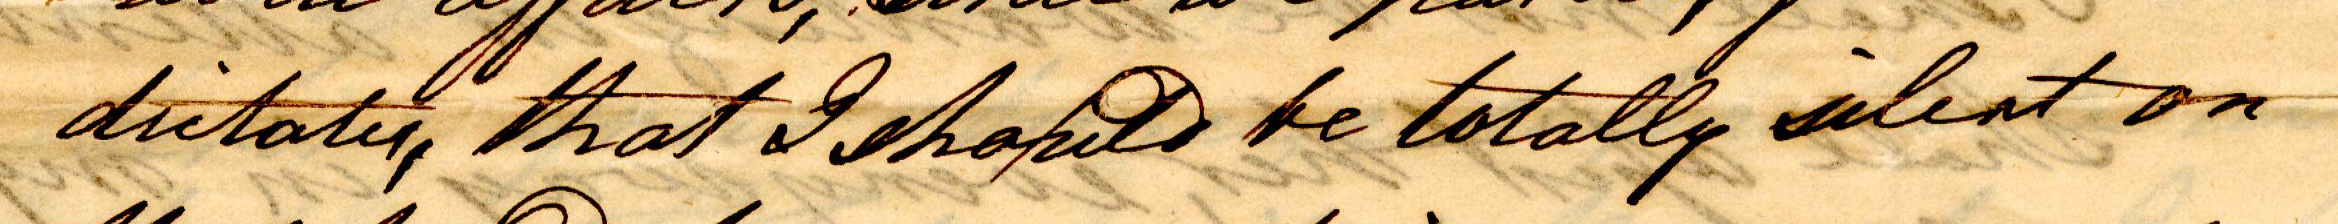dictates, that I should be totally silent on
